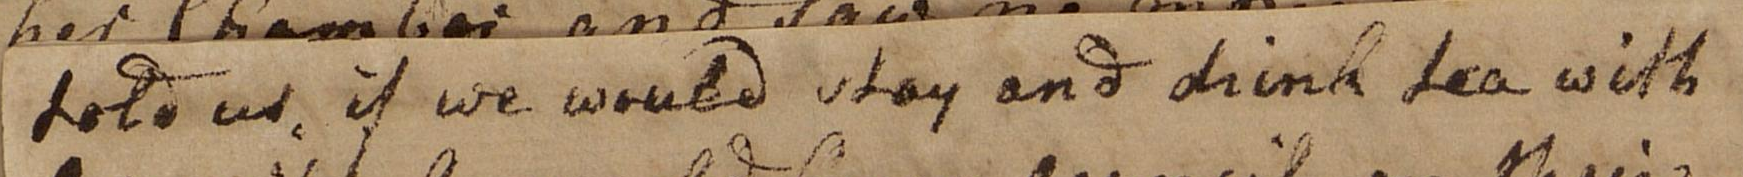told us, if we would stay and drink tea with
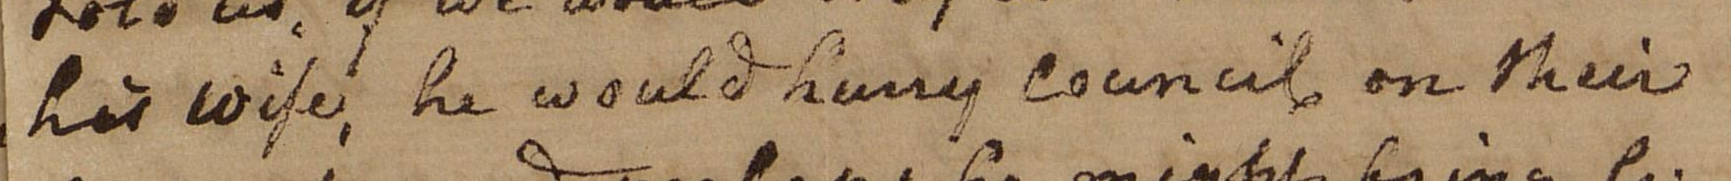his wife, he would hurry council on their
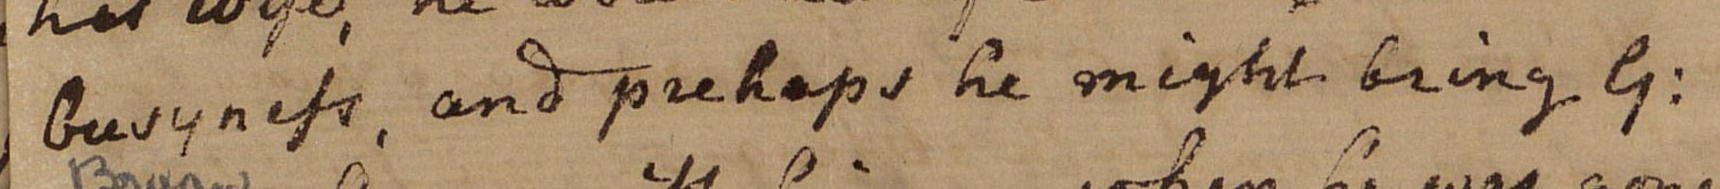busyness, and prehaps he might bring G:
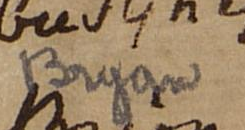Bryan
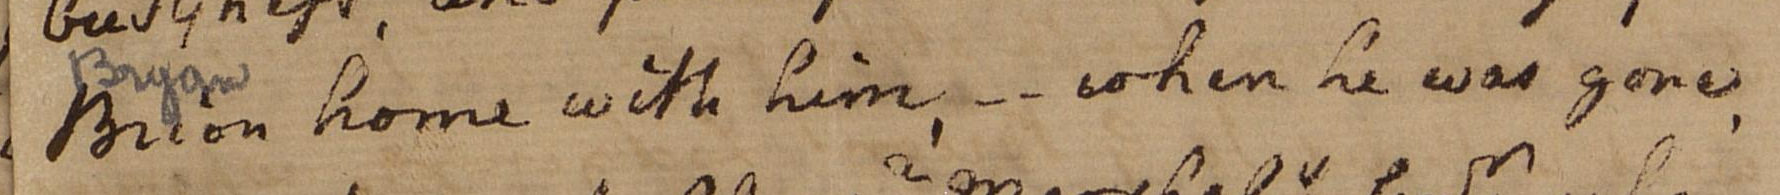Brion home with him,-- when he was gone,
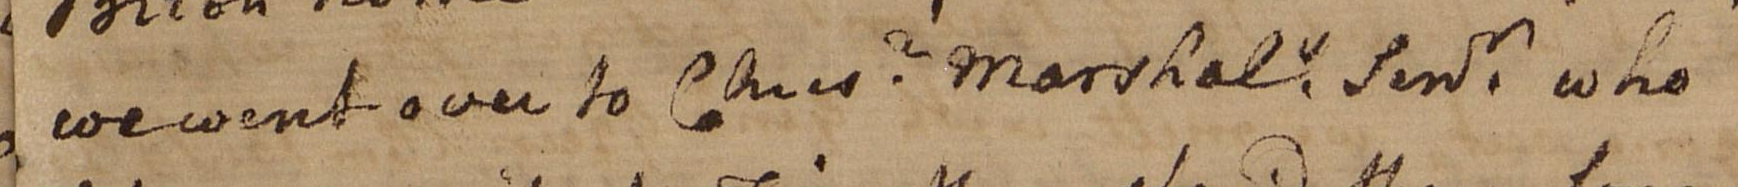we went over to Chris^r. Marshal^s. Sen.^r who
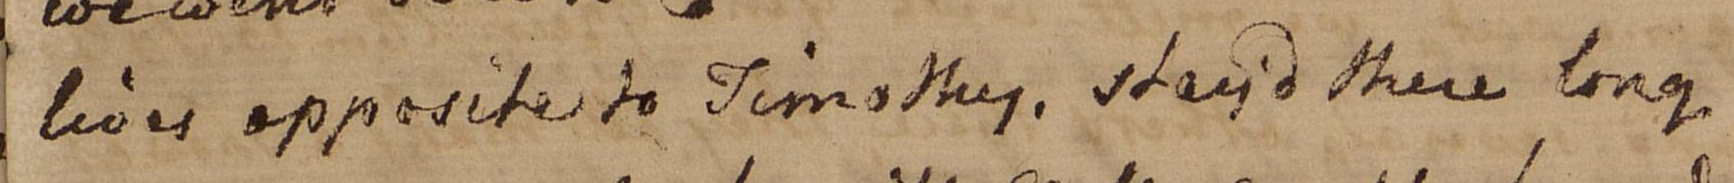lives opposite to Timothy, stay'd there long
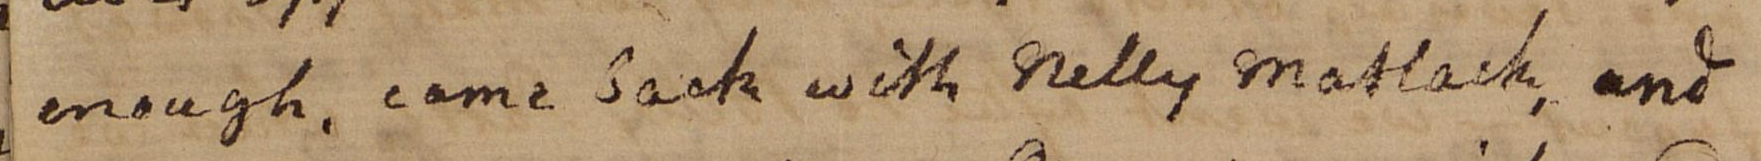enough, came back with Nelly Matlack, and
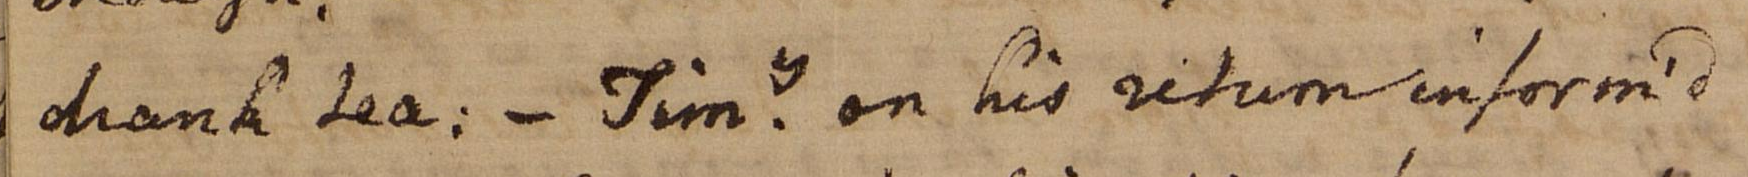drank tea:- Tim^y. on his return inform'd
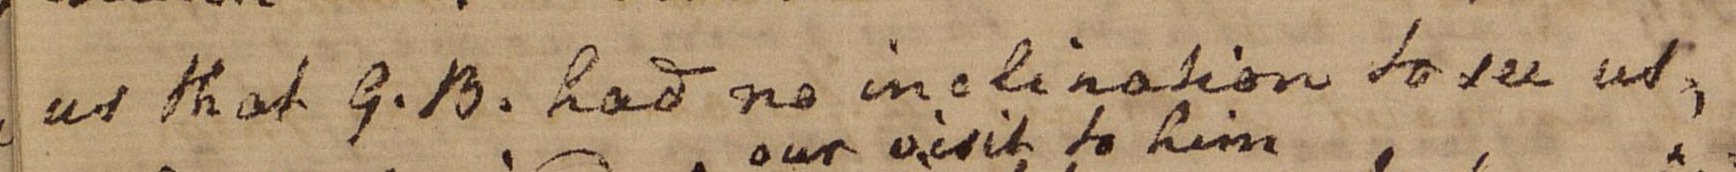us that G. B. had no inclination to see us,
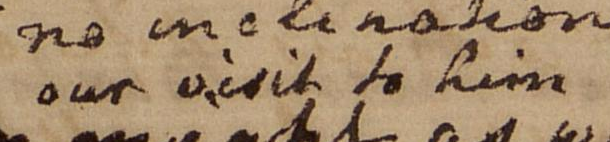our visit to him
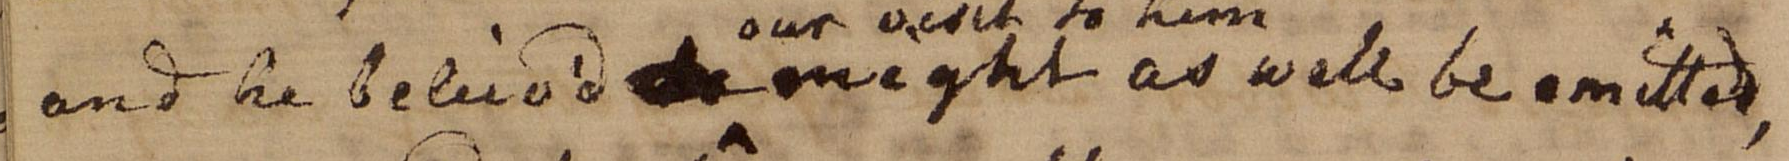and he beleiv'd he might as well be omitted,
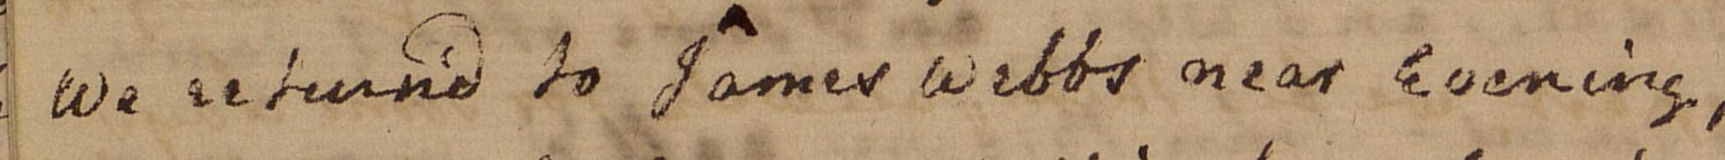We return'd to James Webbs near Evening,
